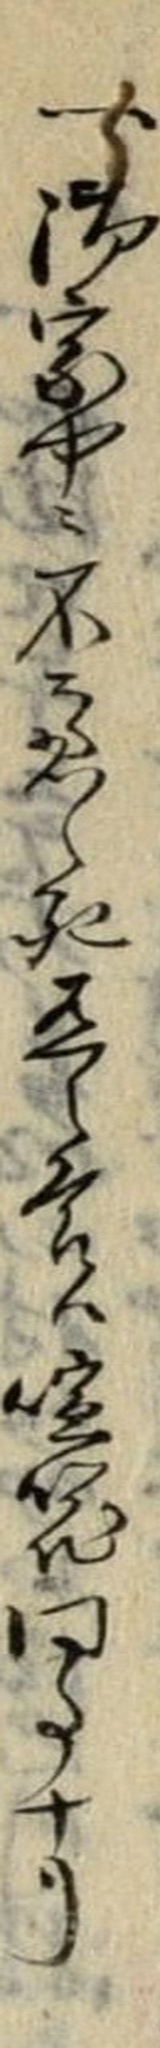一御家中に不慮之死有之節は喧嘩同事ナリ
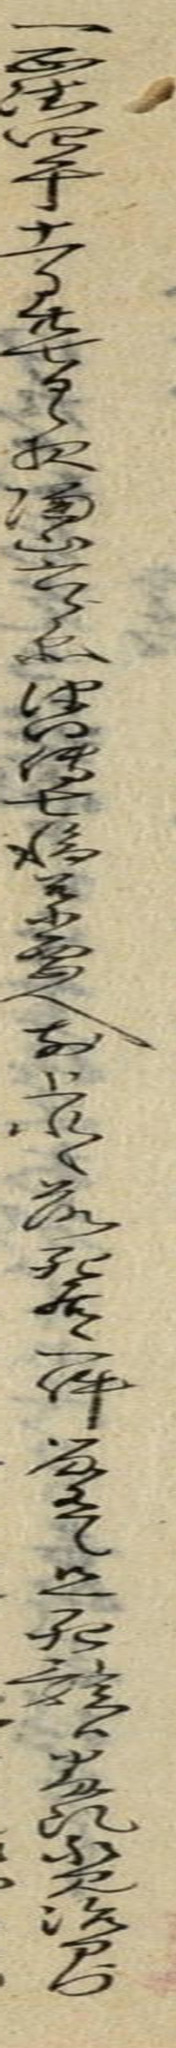一正徳四午十一月廿七日之夜陶山六兵衛津田伝七稲葉小要人前上水へ落死居候一件留有之且死骸は番頭永見治部右衛門
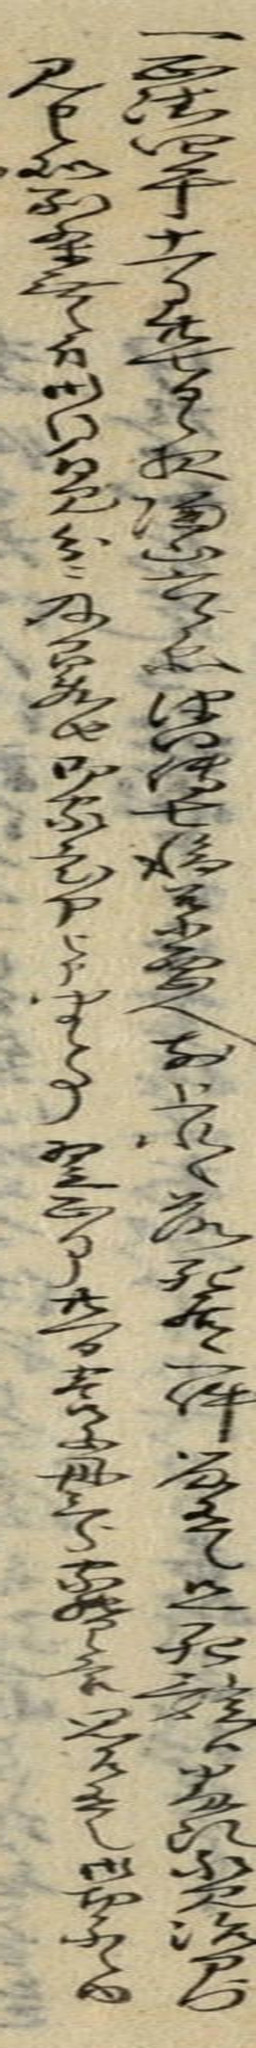見申候処別条無之に付御目付見分に及間敷由御家老中被申聞候事翌正月廿一日養子丹三郎家督之節思召有之御切米之内
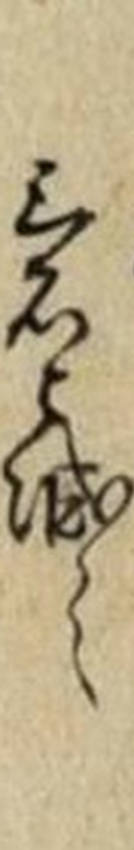三石被減之
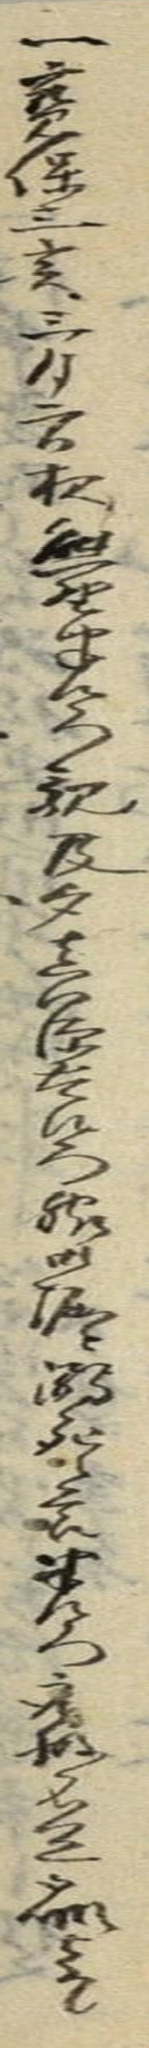一寛保三亥三月二日夜熊野半左衛門親及夕真田源太左衛門脇御堀に溺死之節半左衛門取扱不宜御暇被下候
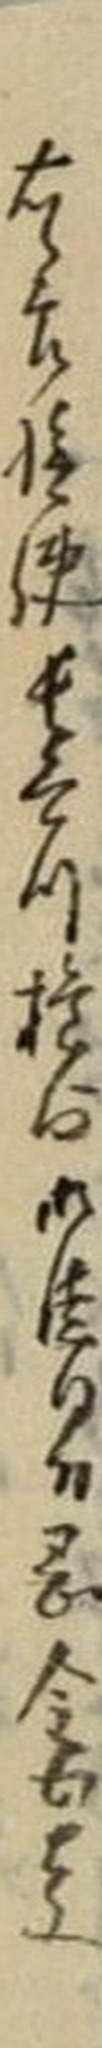右之節検使長谷川権右衛門御徒目付岡金五大夫
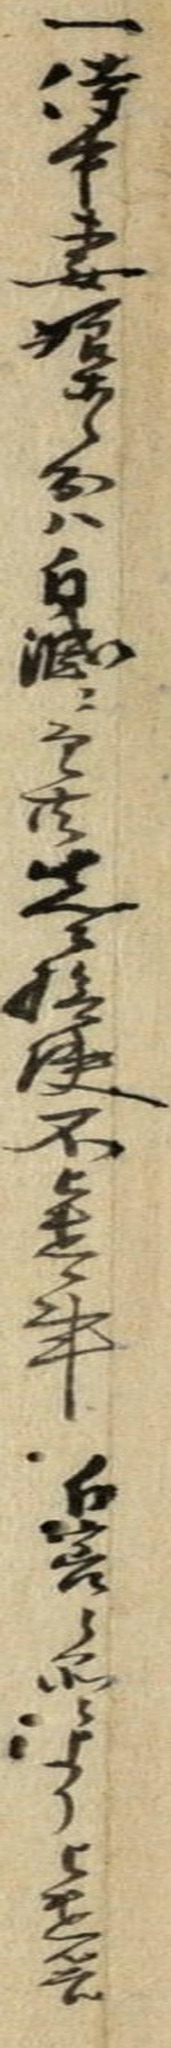一侍中妻娘等之分は自滅にて候共先に検使不被遣候事自害之品により被遣筈
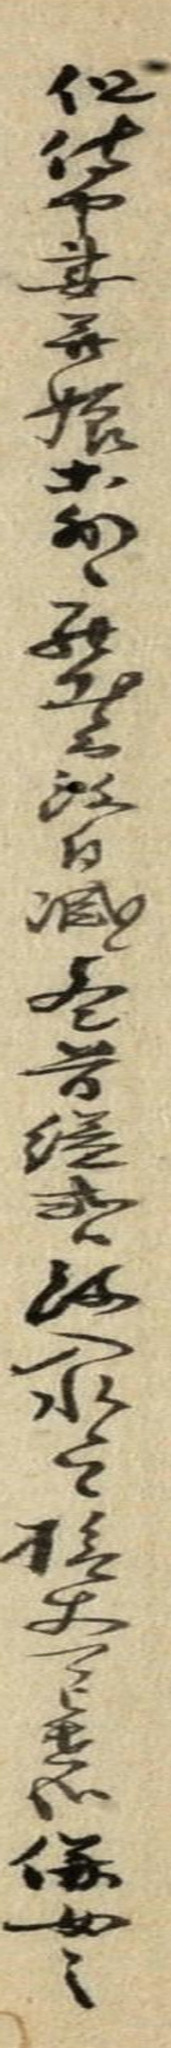但侍中妻并娘等外へ罷出候て致自滅候歟首縊或は入水候はゝ検使可被遣哉併女之
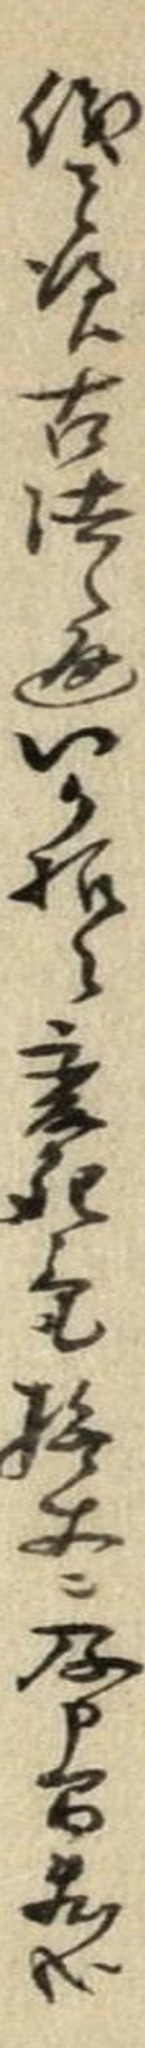儀に候得は古法之通いか様之変死にても検使に及間敷哉
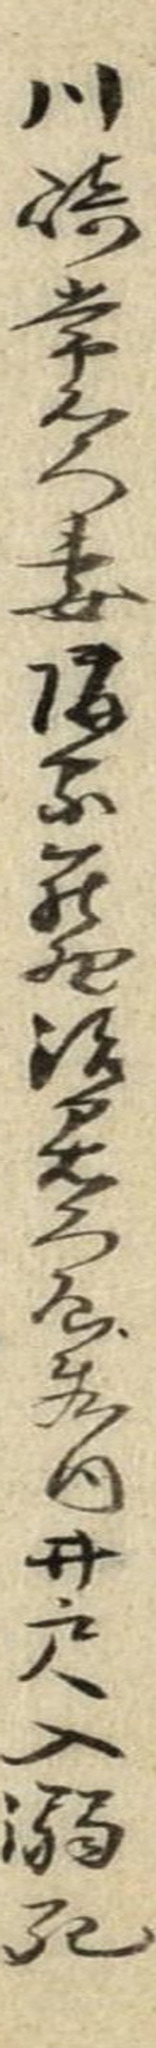一川崎常右衛門妻御家荻野治部右衛門屋敷内井戸へ入溺死
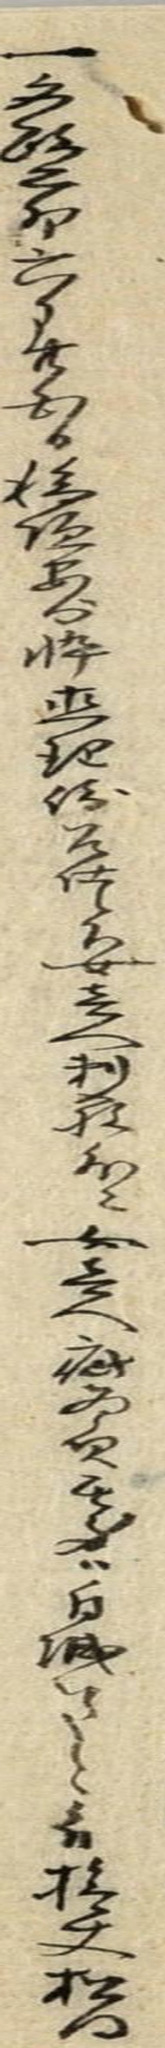一文政二卯六月廿五日稲垣安右衛門悴直理儀召仕之下女壱人刺殺外に女壱人疵為負其身は自滅いたし候に付検使松田

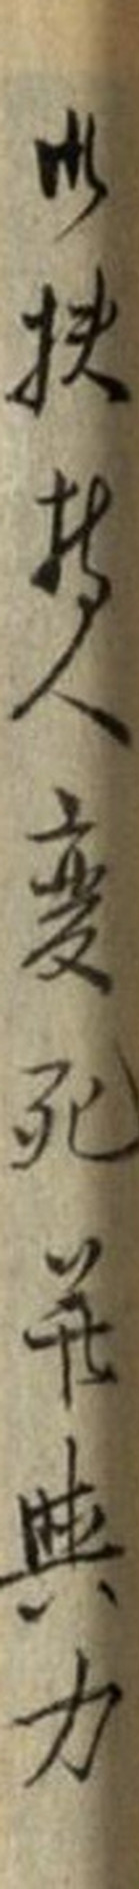御扶持人変死并与力
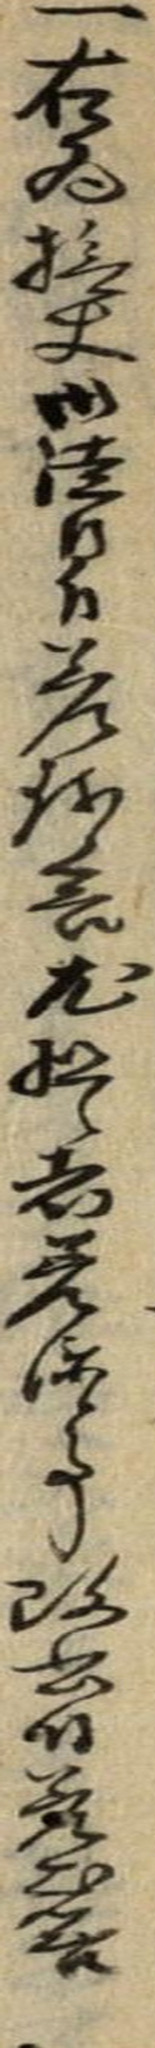一右為検使御徒目付差越筈尤組之者差添候事改書付差出筈
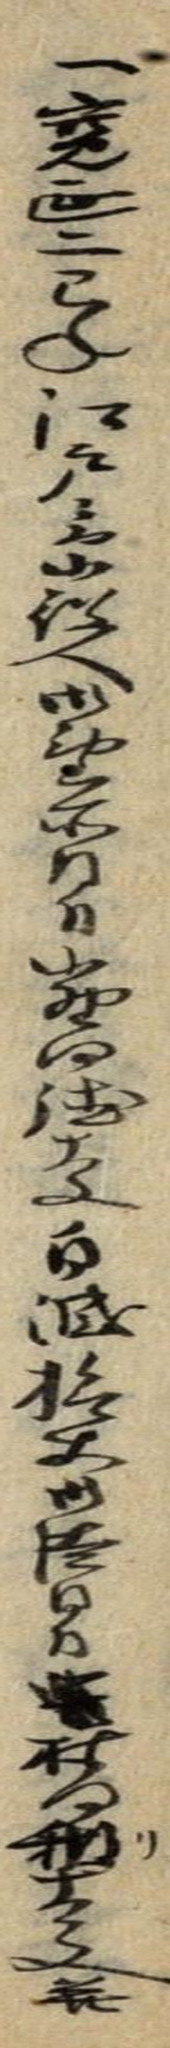一寛延二巳年江戸にて小役人御座所目付小野田徳大夫自滅検使御徒目付村田利大夫并
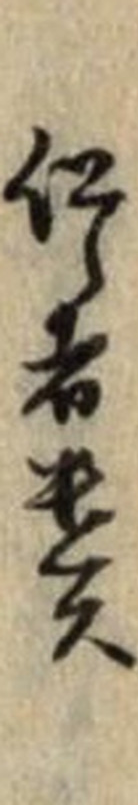組之者遣ス
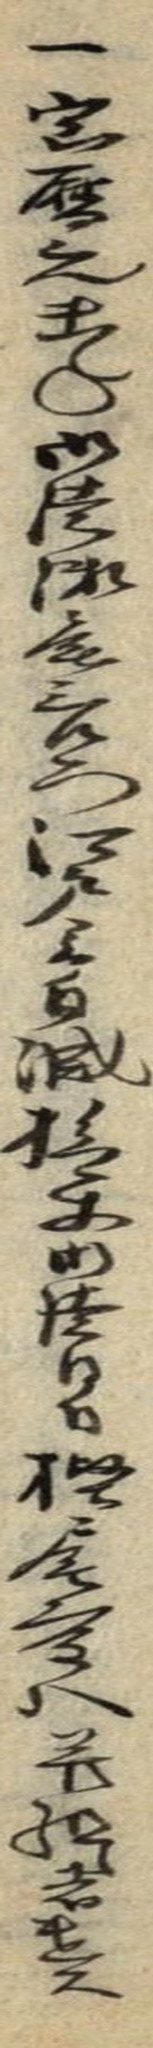一宝暦元未年御徒瀬尾三左衛門江戸にて自滅検使御徒目付樫尾藤八并組之者遣ス
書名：御停止異変死失
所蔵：福井県文書館 Fukui Prefectural Archives
